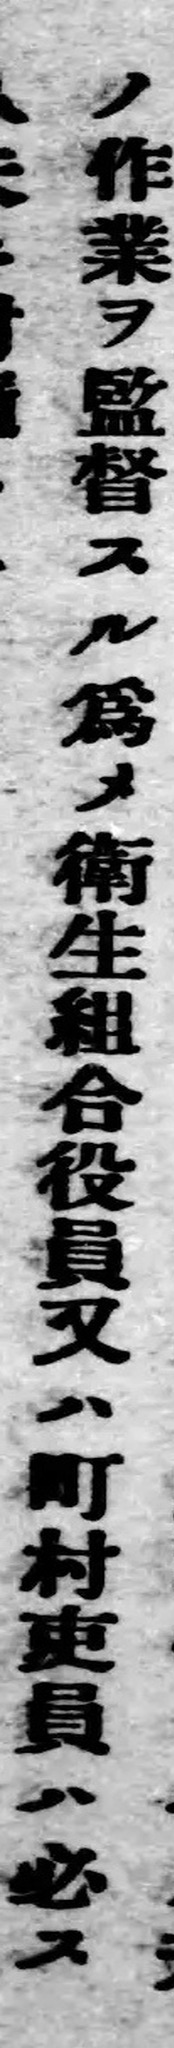ノ作業ヲ監督スル爲メ衛生組合役員又ハ町村吏員ハ必ス
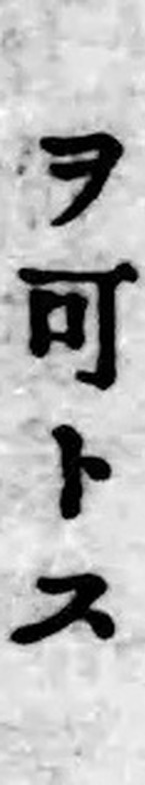ヲ可トス
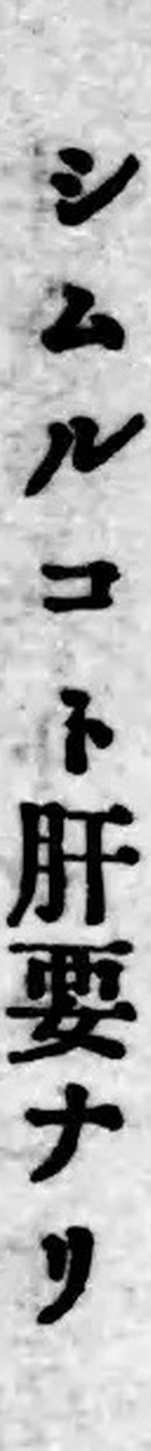シムルコト肝要ナリ
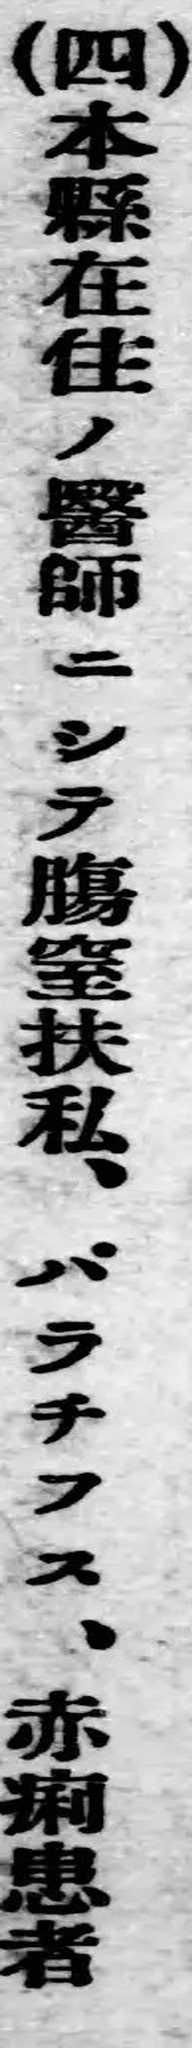(四)本縣在住ノ醫師ニシテ膓窒扶私、パラチフス、赤痢患者

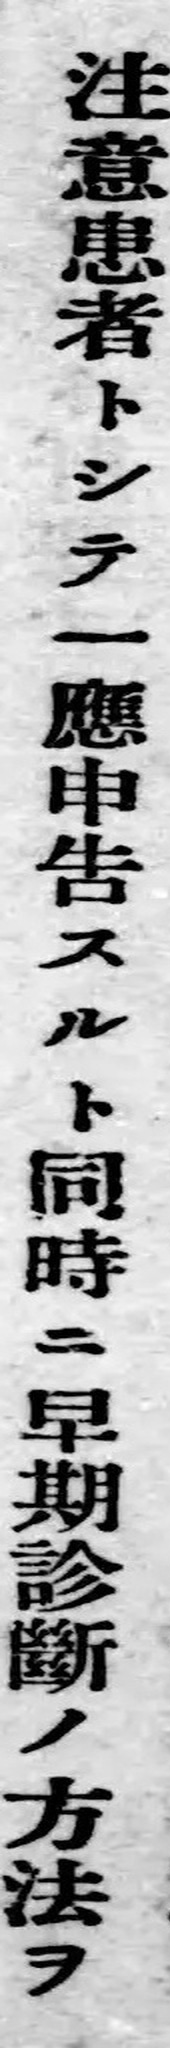注意患者トシテ一應申告スルト同時ニ早期診斷ノ方法ヲ
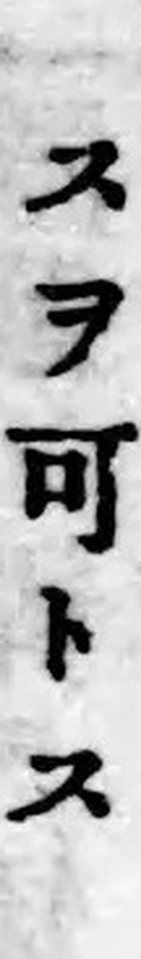スヲ可トス
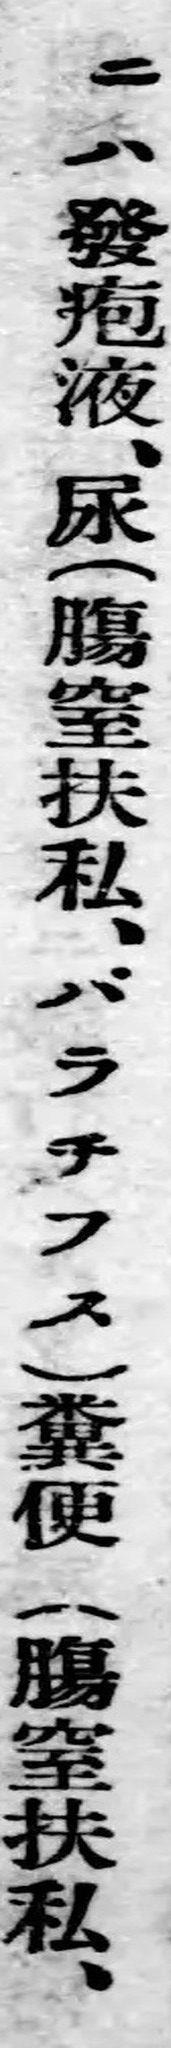ニハ發疱液、尿(膓窒扶私、パラチフス)糞便(膓窒扶私、
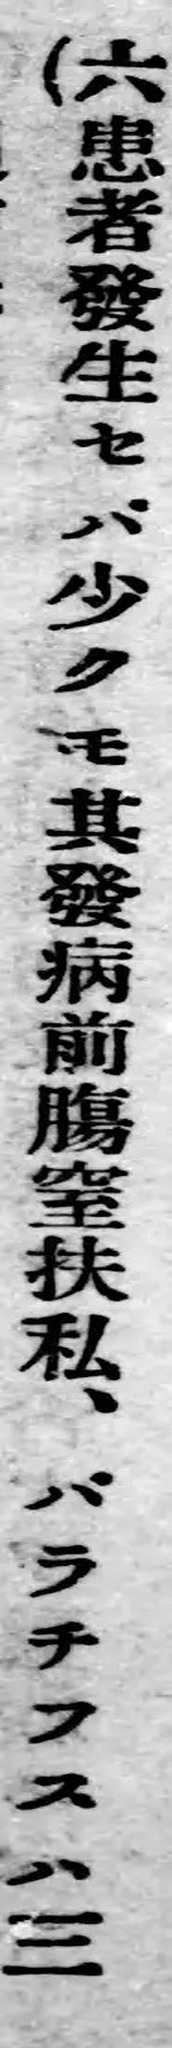(六)患者發生セバ少クトモ其發病前膓窒扶私、パラチフスハ三
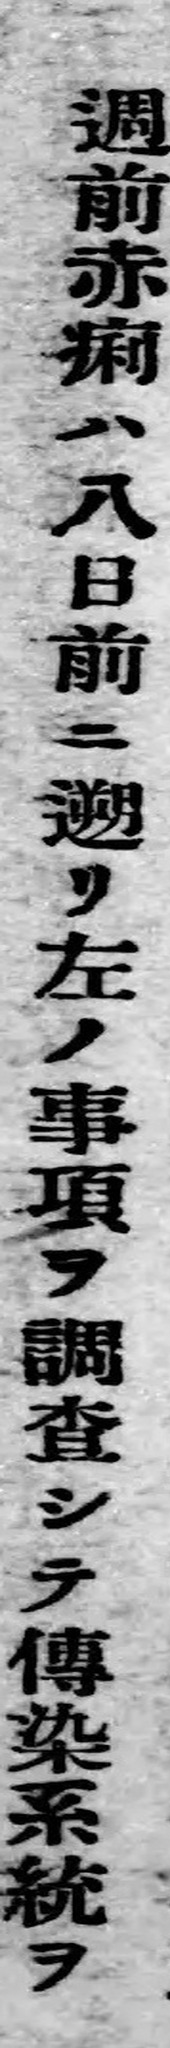週前赤痢ハ八日前ニ遡リ左ノ事項ヲ調査シテ傅染系統ヲ
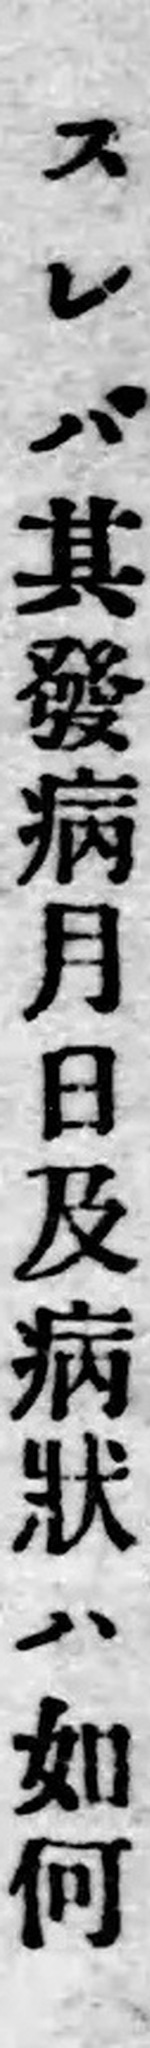スレバ其發病病月日及病狀ハ如何
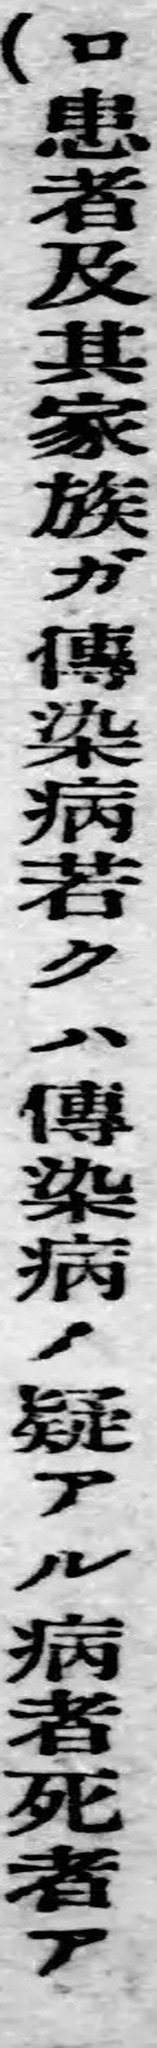(ロ)患者及其家族ガ傅染病若クハ傅染病ノ疑アル病者死者ア
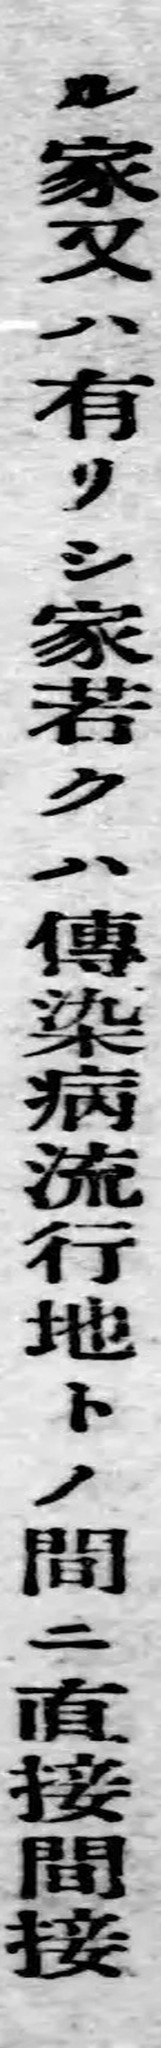ル家又ハ有リシ家若クハ傅染病流行地トノ間ニ直接間接
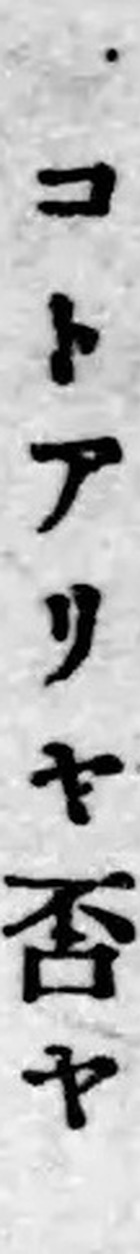コトアリヤ否ヤ
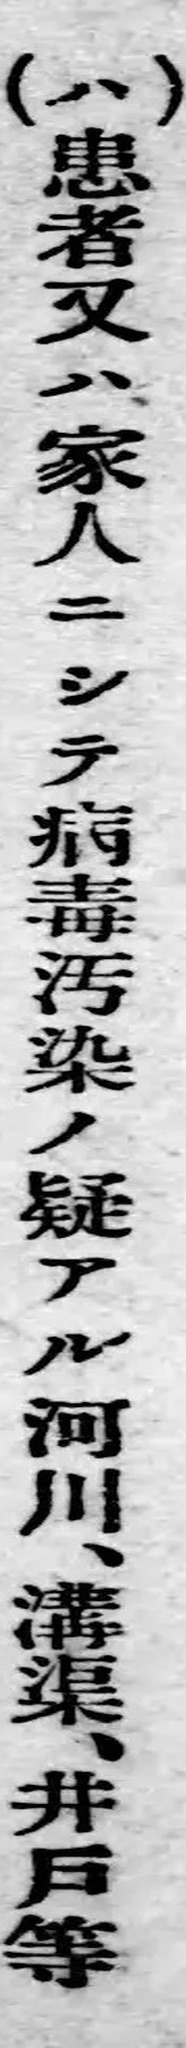(ハ)患者又ハ家人ニシテ病毒汚染ノ疑アル河川、溝渠、井戸等
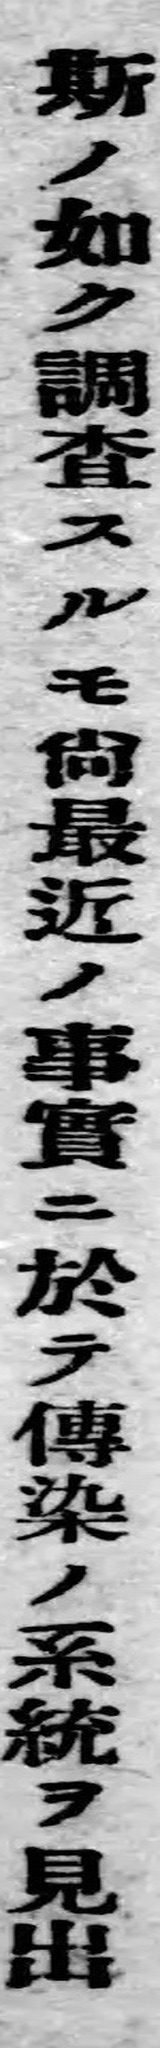斯ク如ク調査スルモ尚最近ノ事實ニ於テ傳染ノ系統ヲ見出
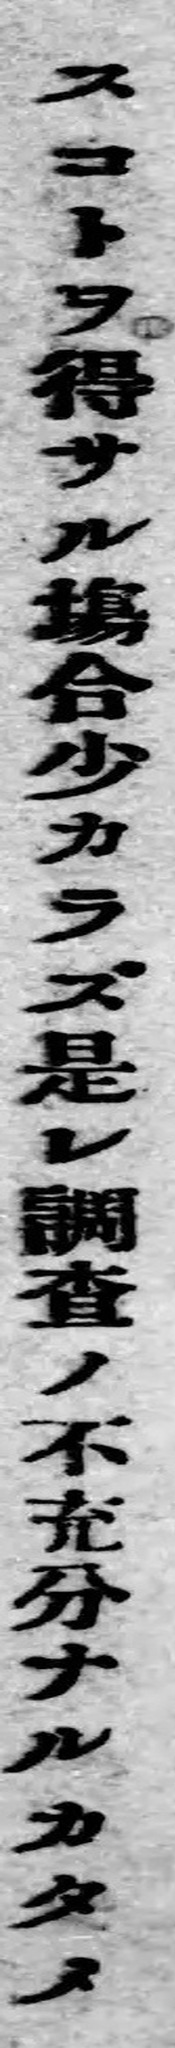スコトヲ得サル塲合少カラズ是レ調査ノ不充分ナルカタメ
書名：袖珍防疫必携
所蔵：国立国会図書館 National Diet Library, JAPAN
